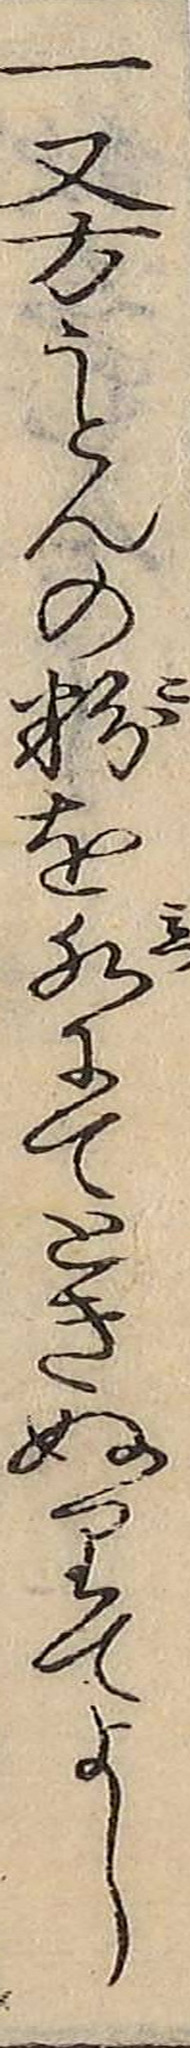一又方うとんの粉を水にてときぬりてよし
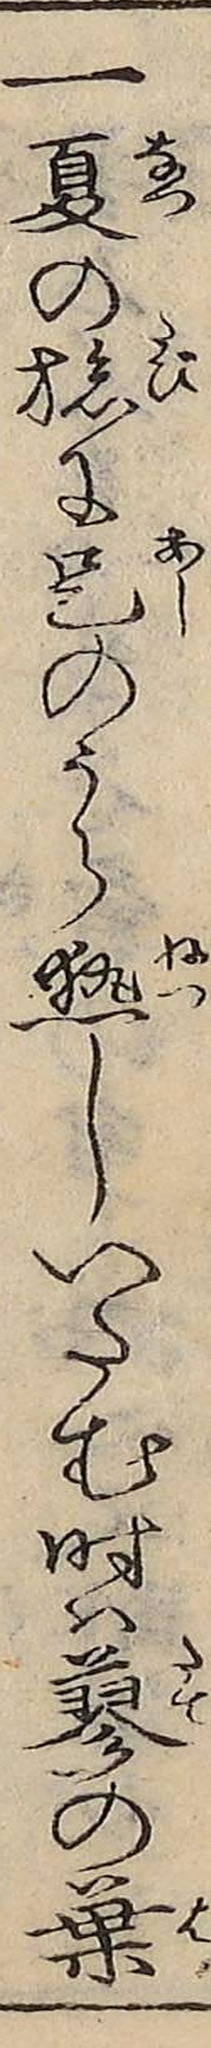一夏の旅に足のうら熱しいたむ時は蓼の葉
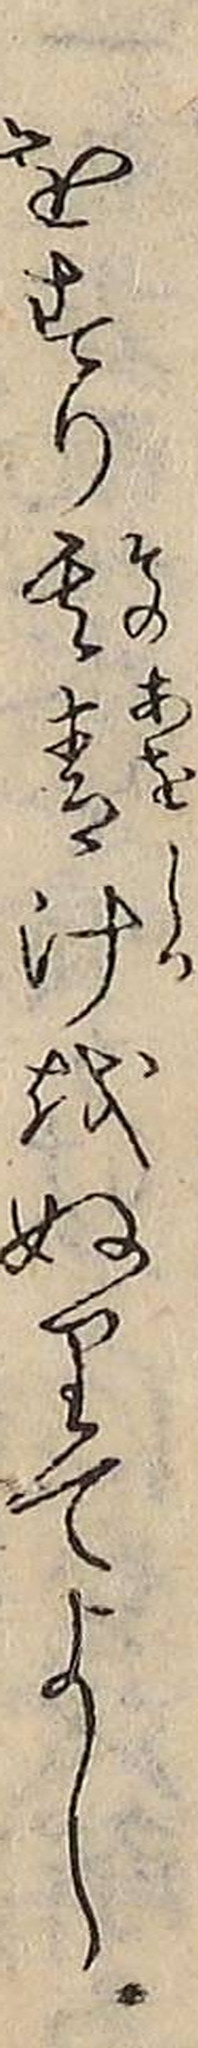をすり其青汁をぬりてよし
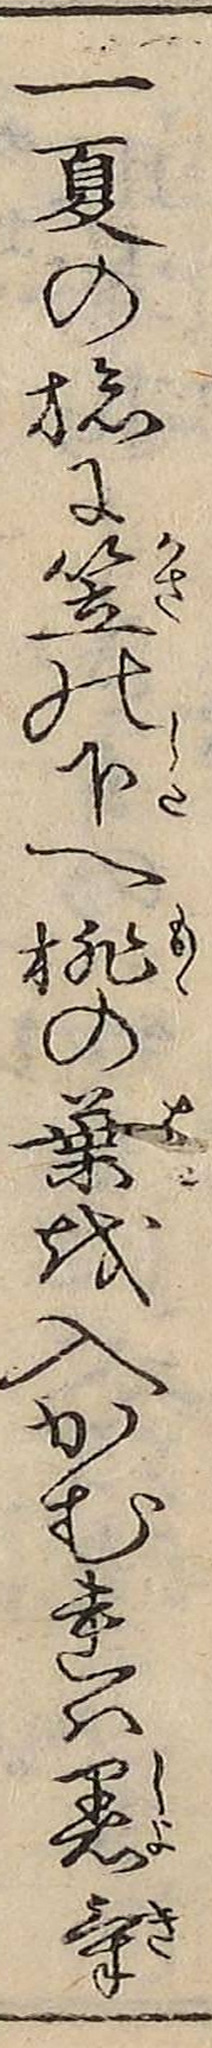一夏の旅に笠の下へ桃の葉を入かむれは暑気
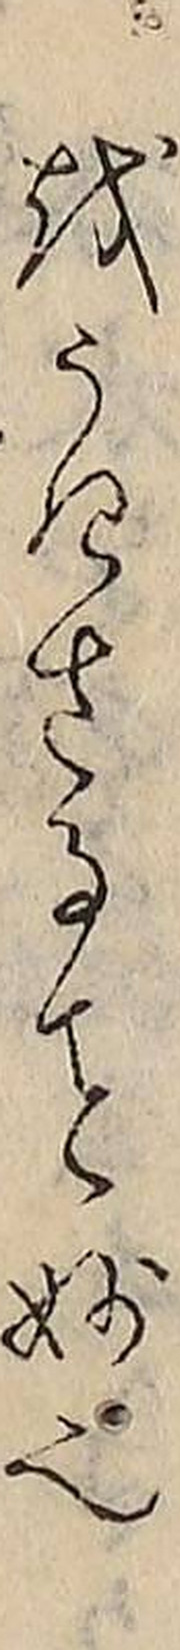をうけさること妙也
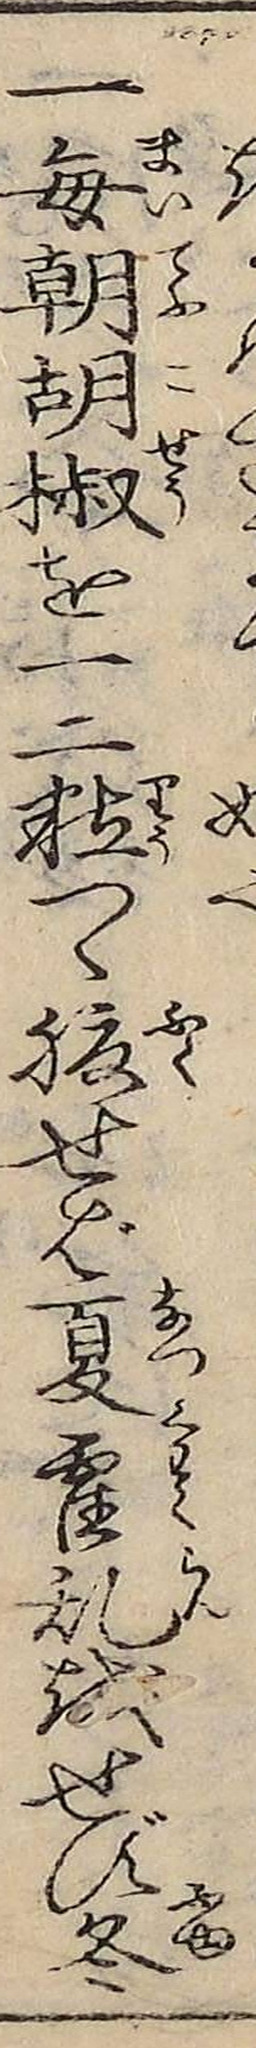一毎朝胡椒を一二粒つゝ服せば夏霍乱をせず冬
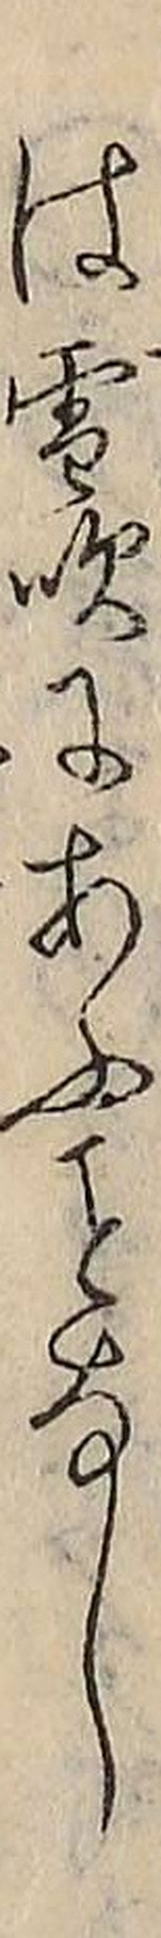は雪吹にあふことなし
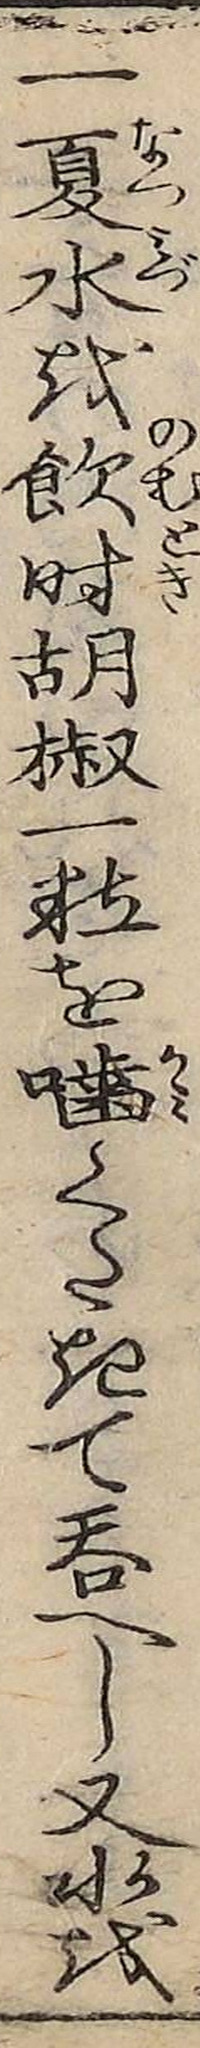一夏水を飲時胡椒一粒を嚙くたきて呑へし又水を
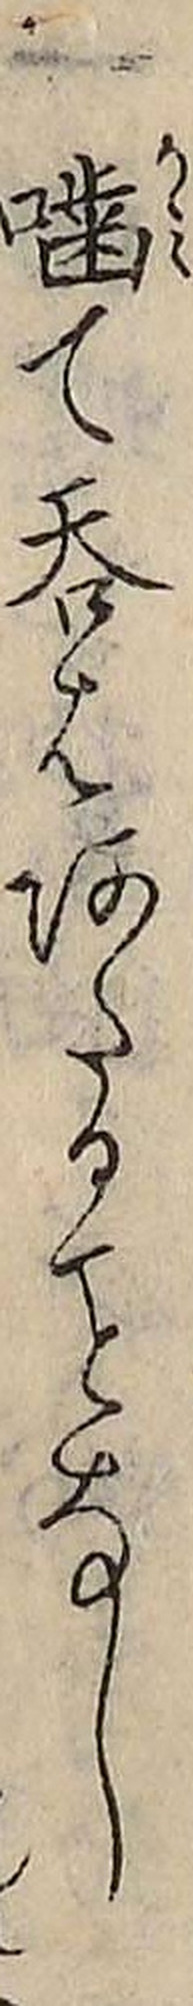嚙て呑はあたることなし
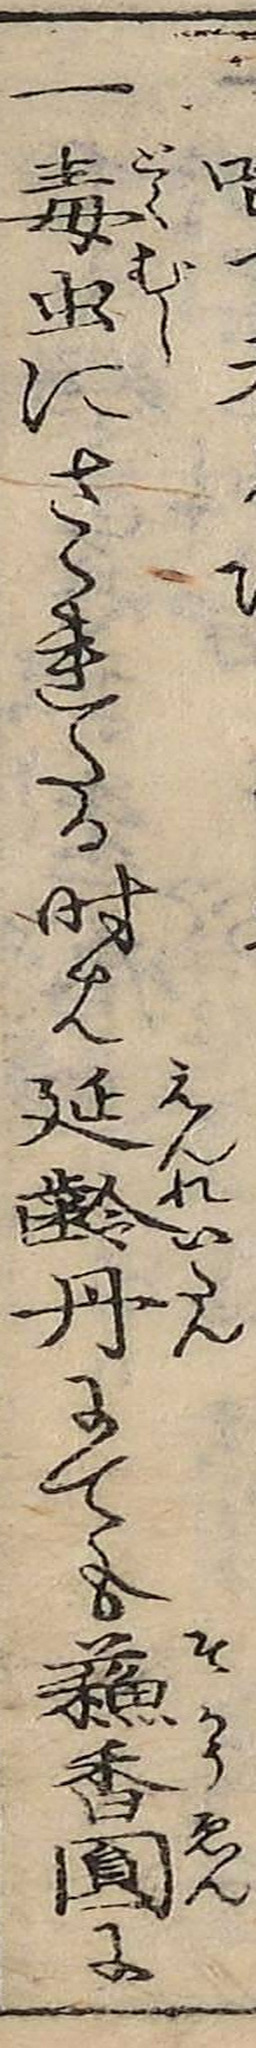一毒虫にさゝれたる時は延齢丹にても蘇香円

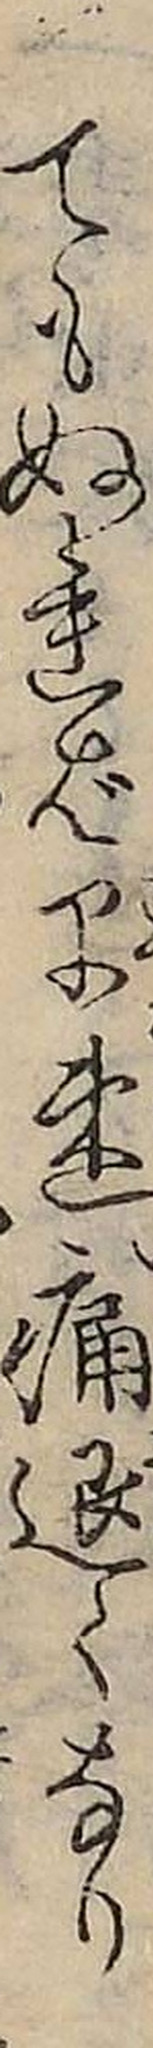てもぬれば早速痛退くなり
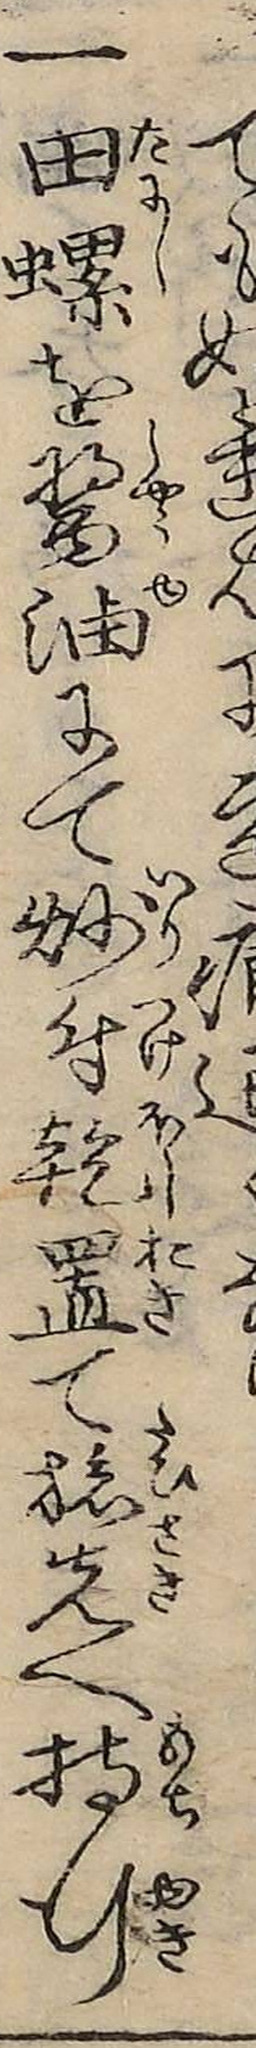一田螺を醤油にて炒付乾置て旅先へ持行
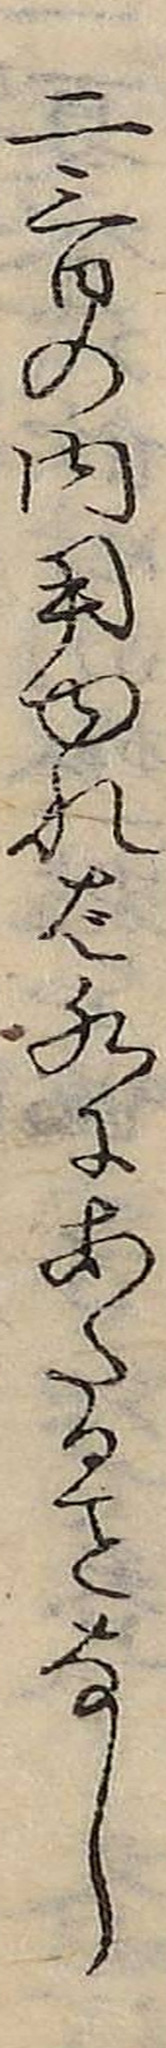二三日の内用ゆれば水にあたることなし
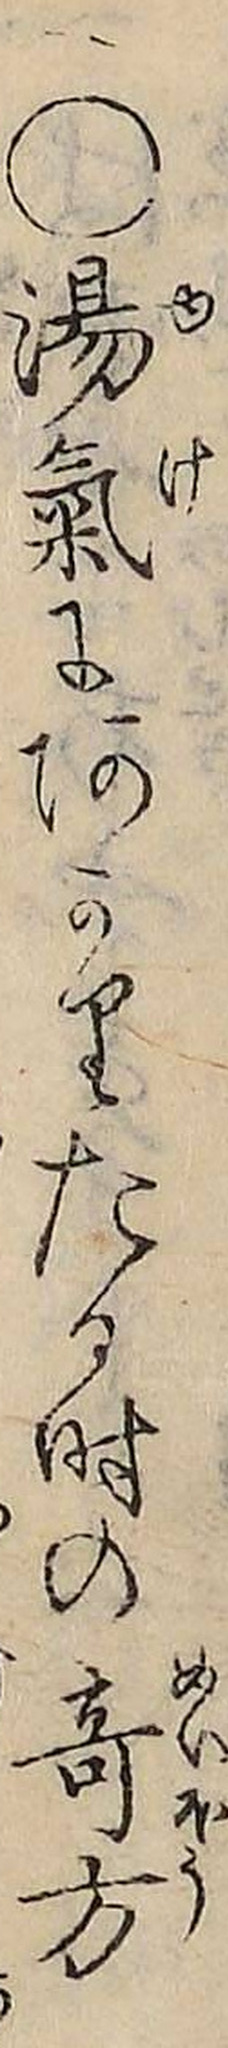○湯気にあかりたる時の奇方
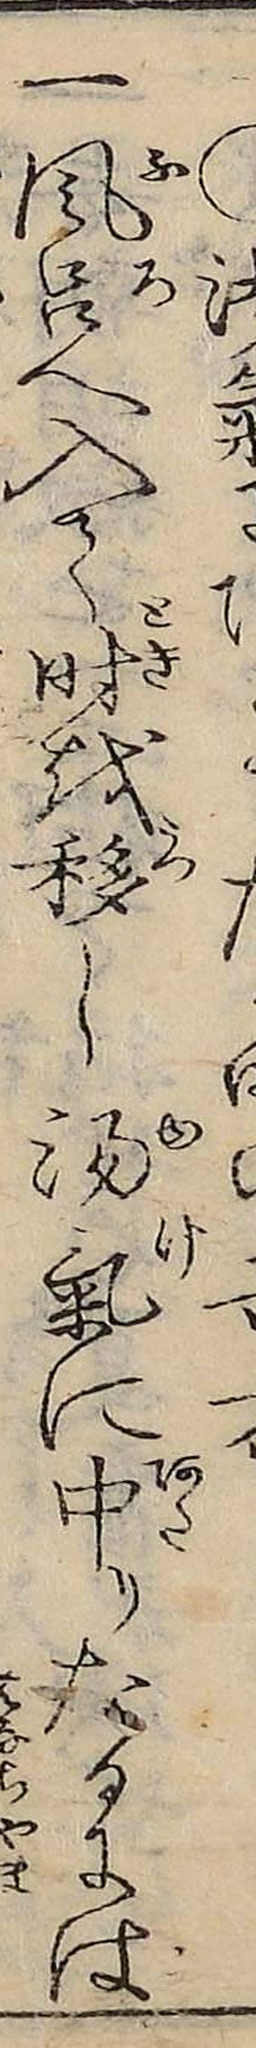一風呂へ入て時を移し湯気に中りたるには
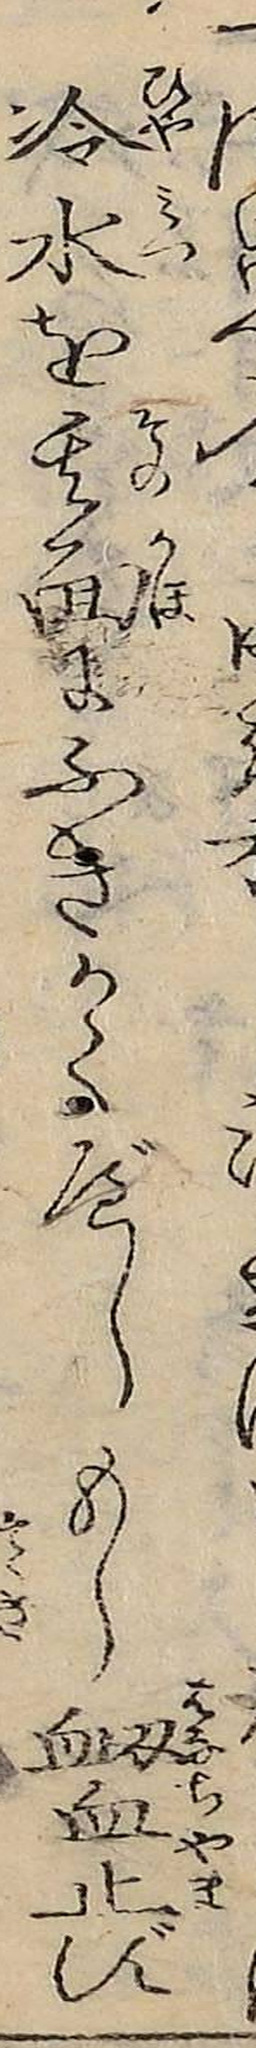冷水を其面にふきかくべしもし衂血止ず
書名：旅行用心集
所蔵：神戸大学附属図書館 国文学研究資料館
